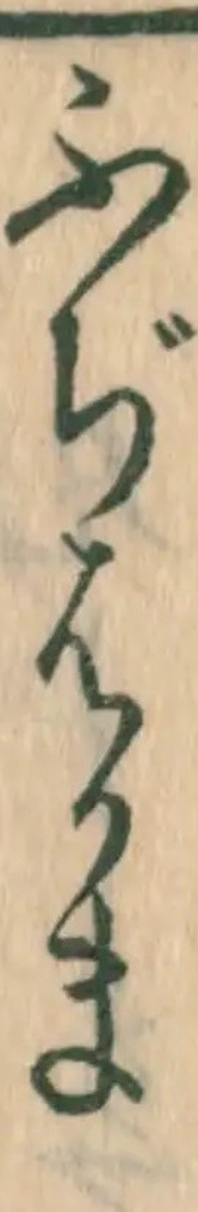ふぢはかま
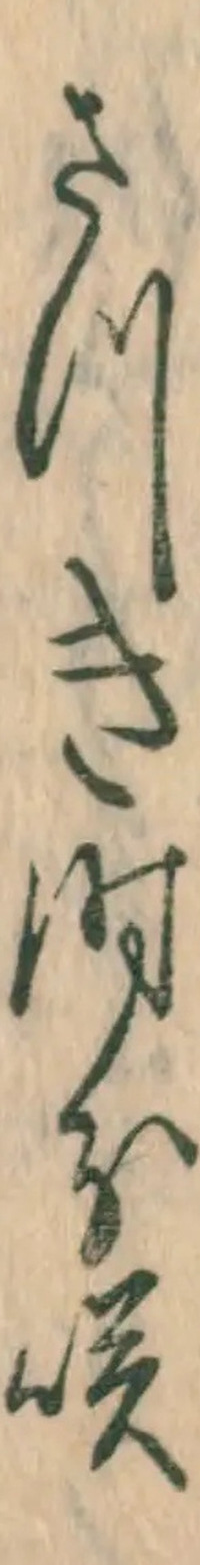さつき時分咲
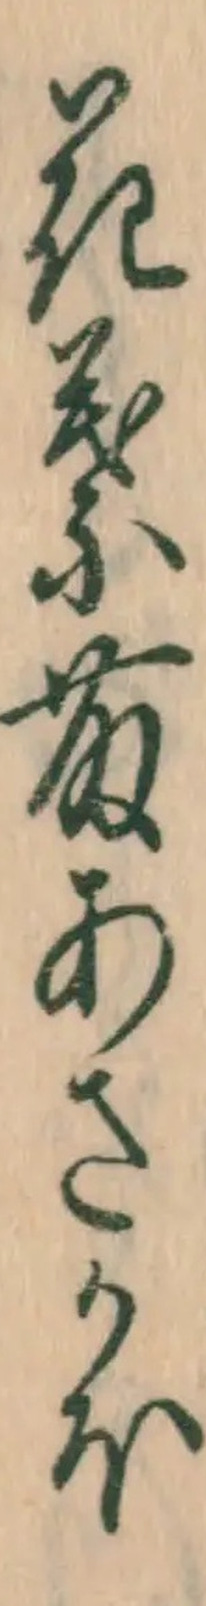花葉藤あさかほ
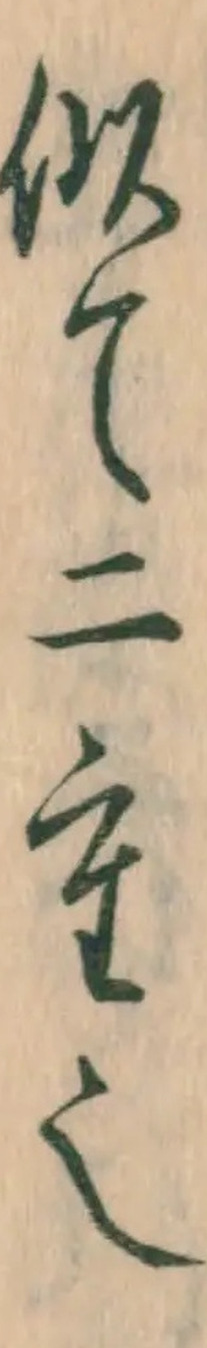似て二重也
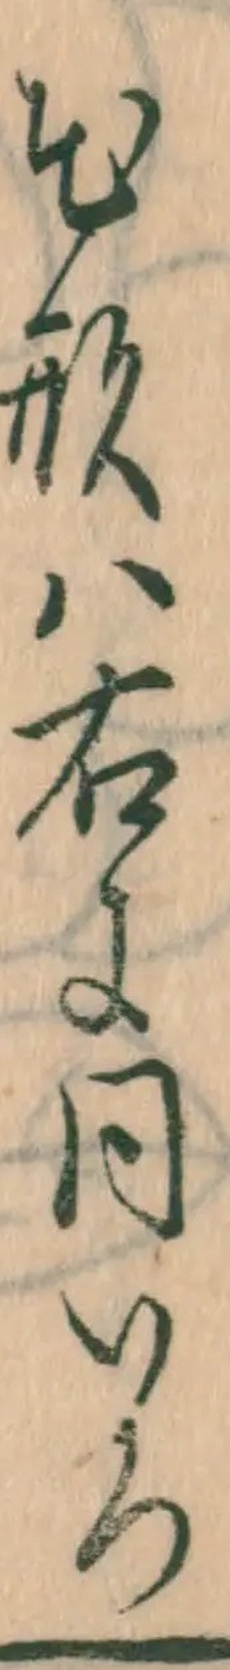花形は右に同いろ
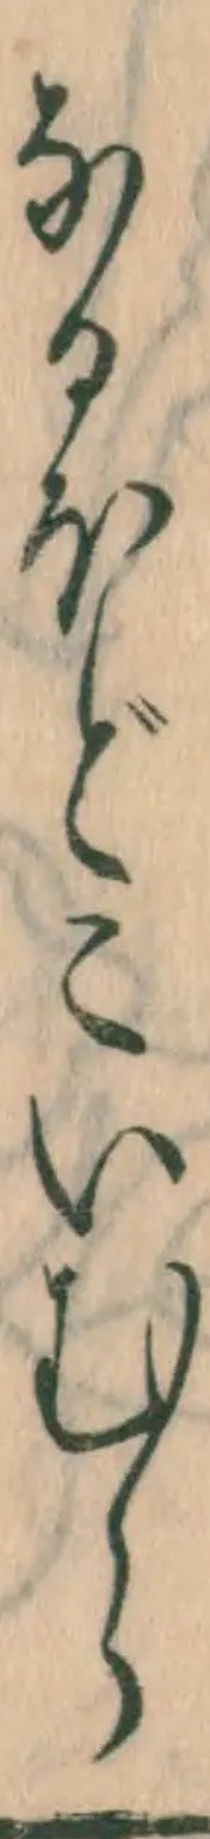なるほどこいむら
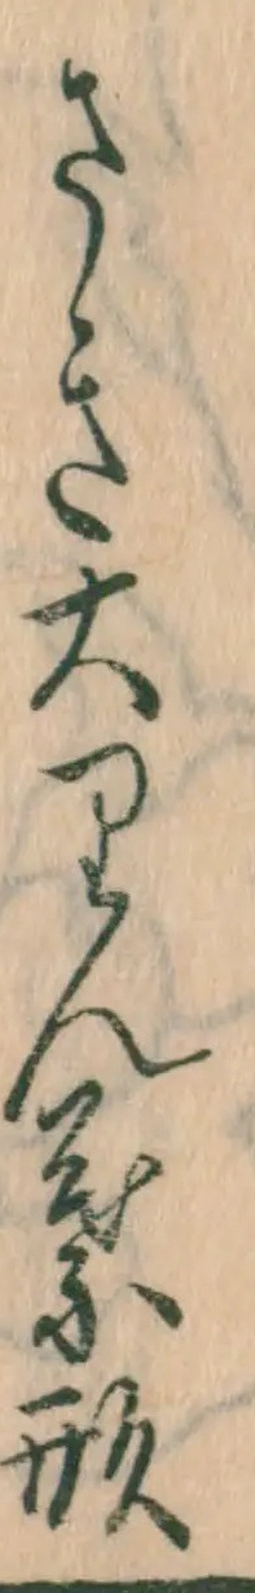さき大りん葉形
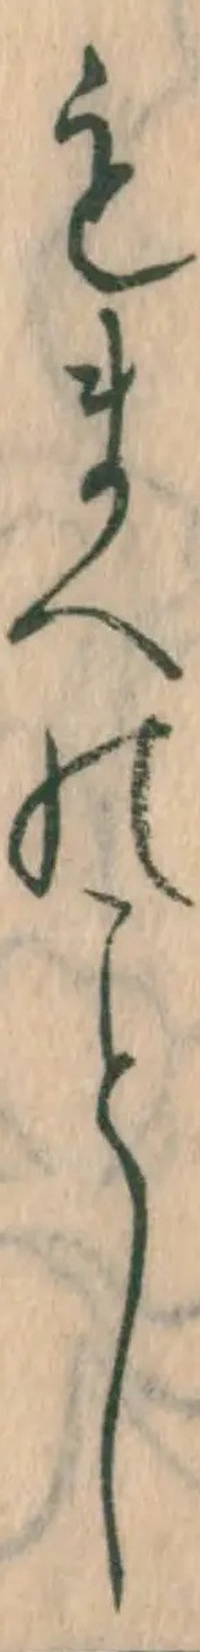もまへのことし
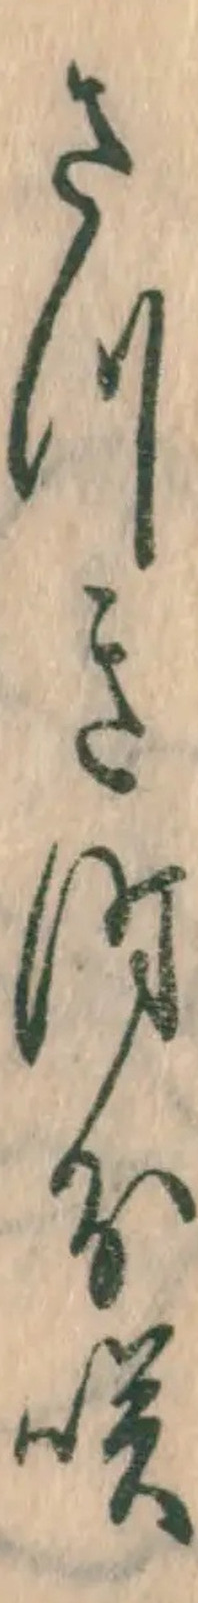さつき時分咲
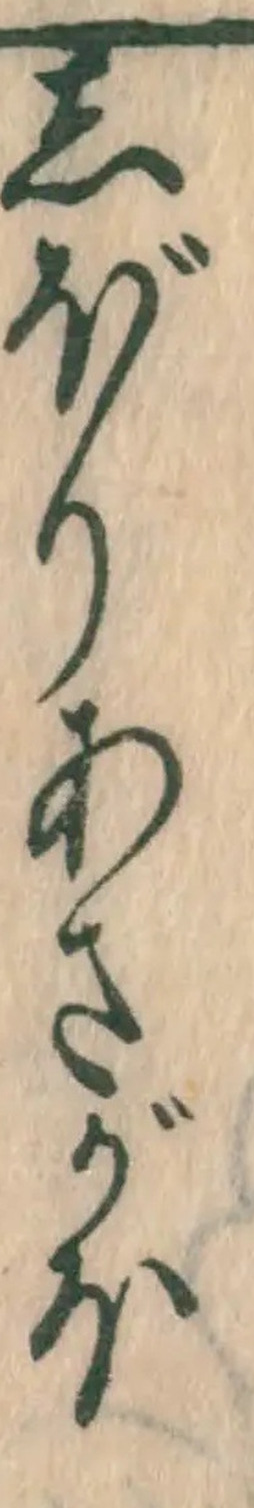しぼりあさがほ
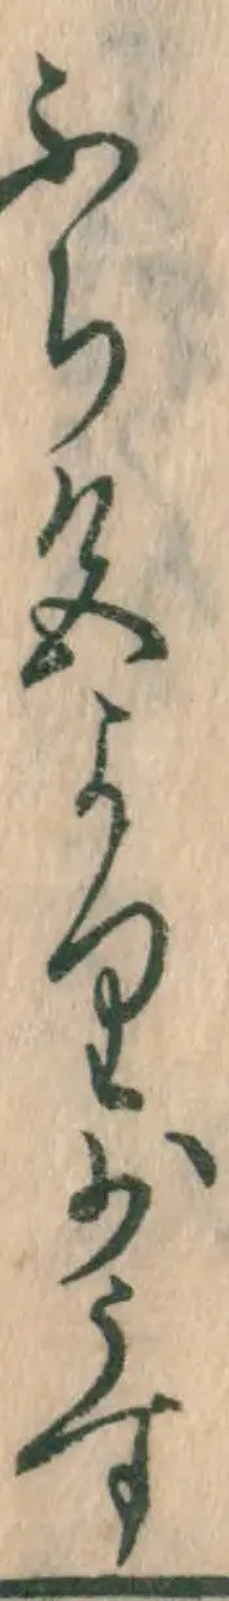ふち色より少うす
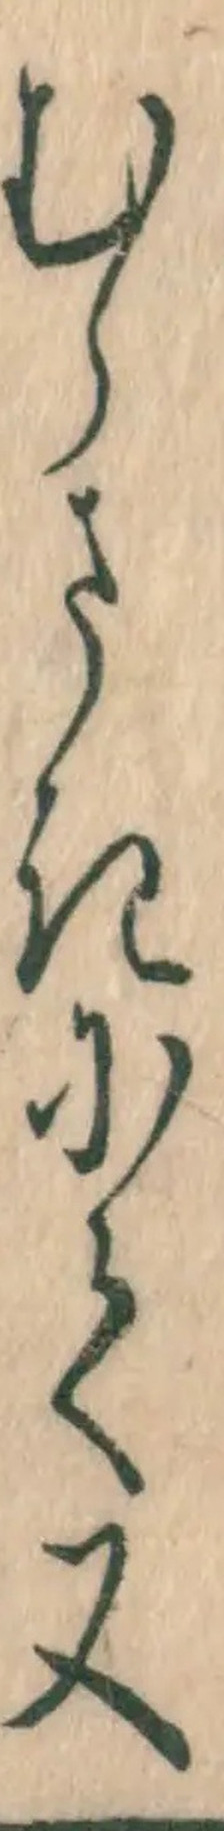むらさきにて又
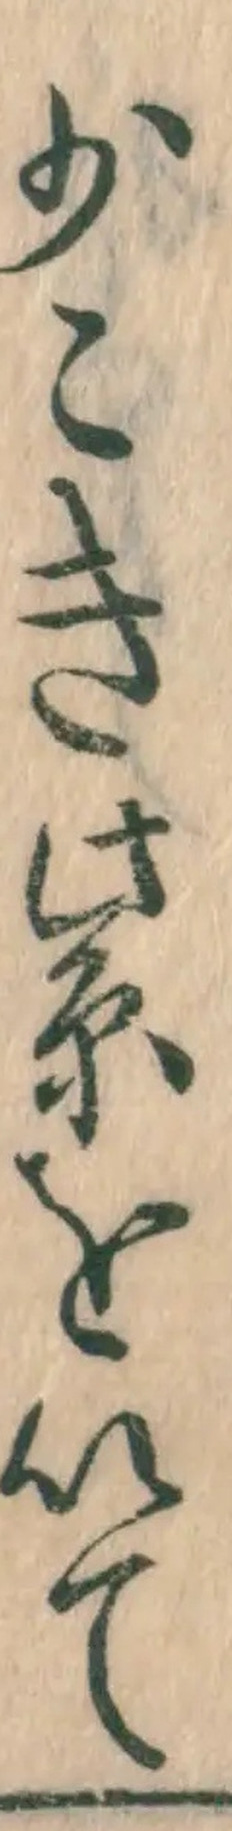少こき紫を以て
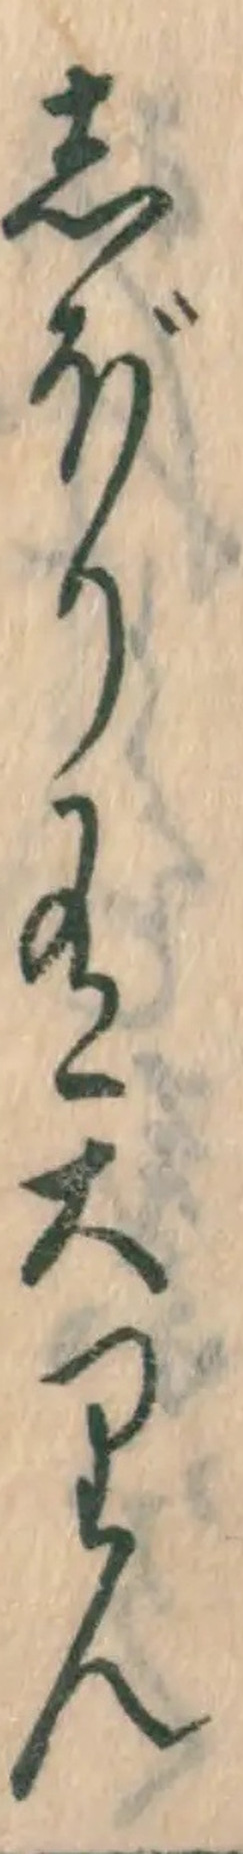しぼり有大りん
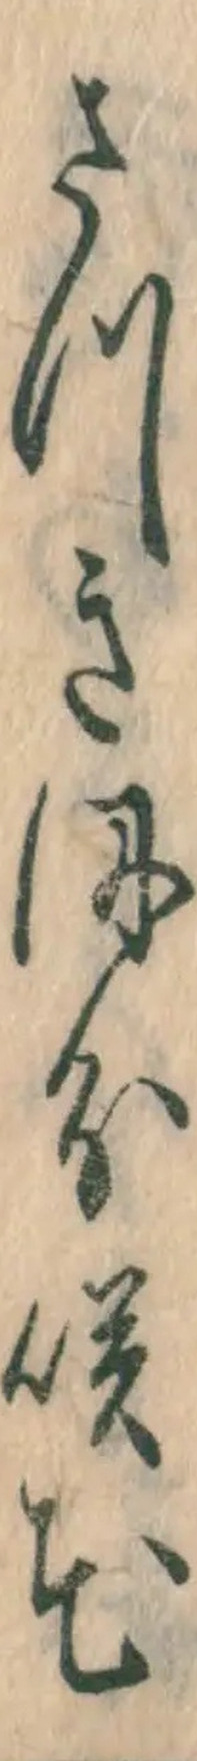さつき時分咲花

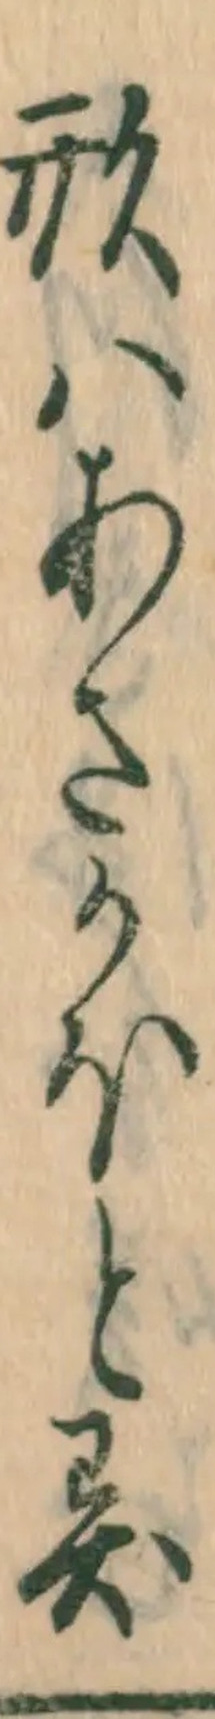形はあさかほと異
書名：錦繍枕 5巻. [2]
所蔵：国立国会図書館 National Diet Library, JAPAN
